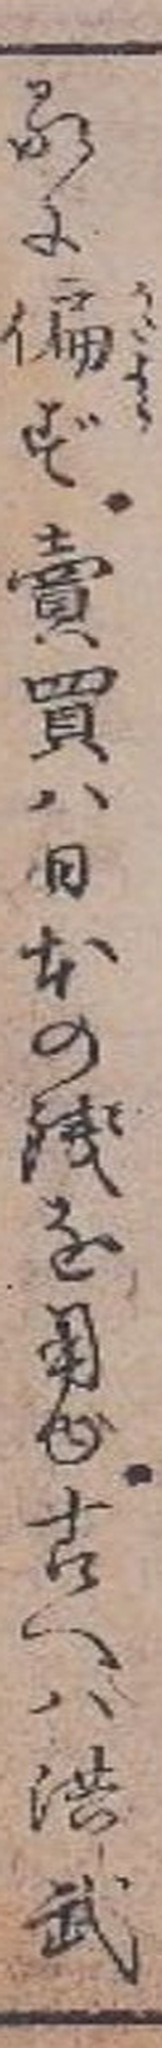るに偏ず、売買は日本の錢を用ゆ、古へは洪武

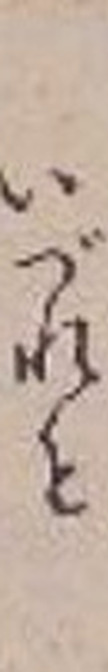いづれも

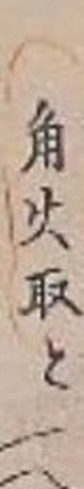角火取と
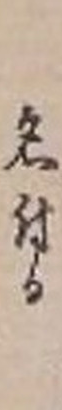名付る
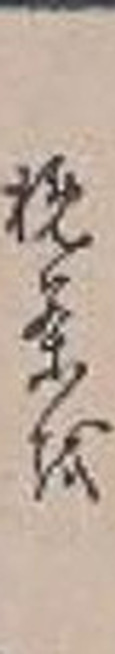挽茶を
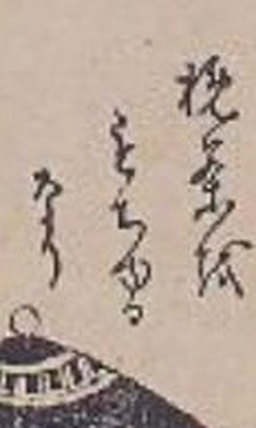もちゆる

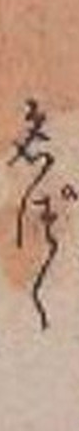名付く
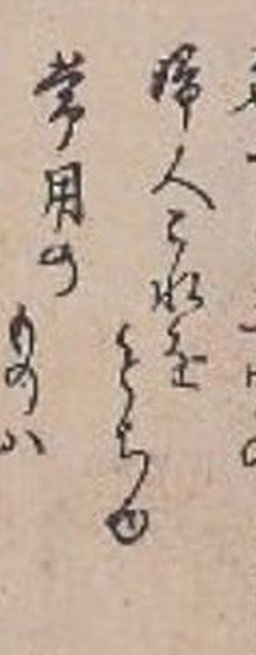もちゆ
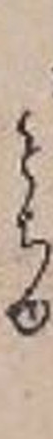もちゆ
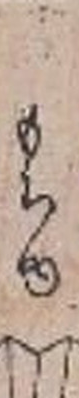もちゆ
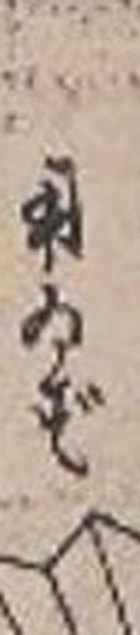用ゐず
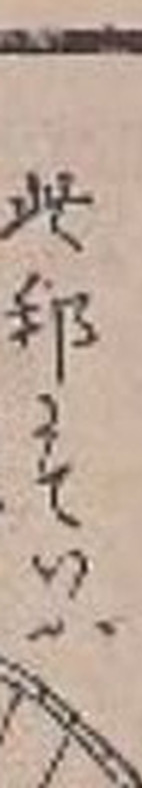此国にていふ
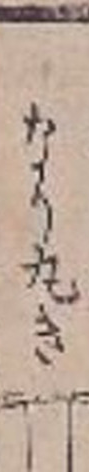なり丸き
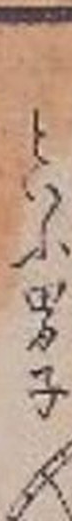といふ男子
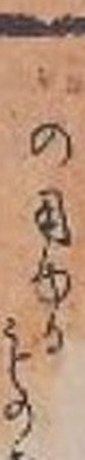の用ゆる
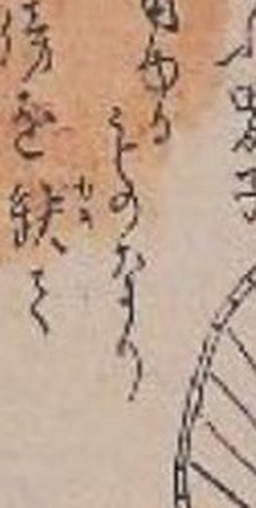ものなり
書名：琉球談
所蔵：University of the Ryukyus Library
